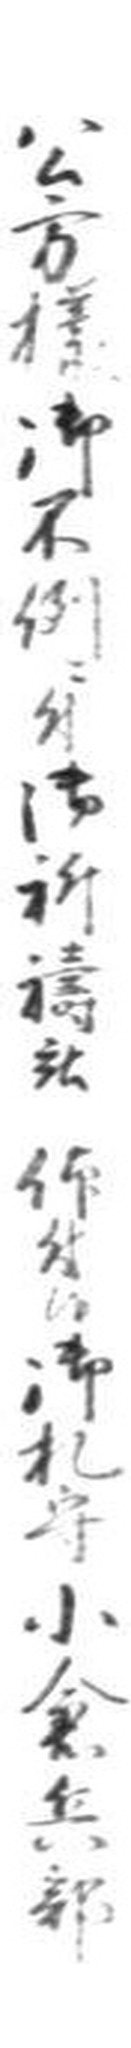公方様御不例ニ付御祈祷被仰付候御札守小倉兵部
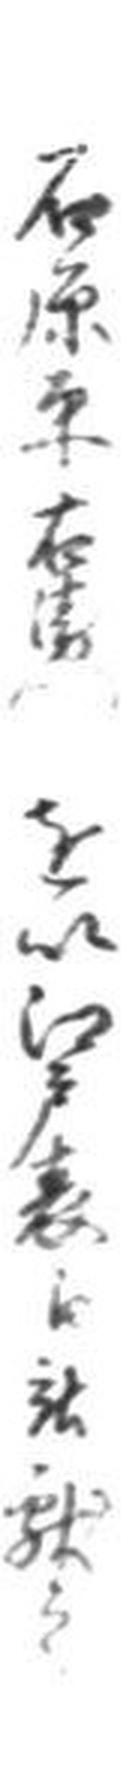石原平右衛門を以江戸表江被献之
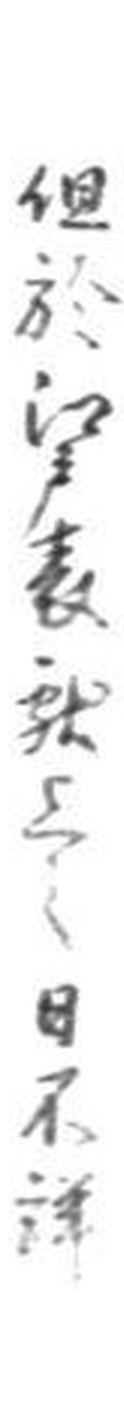但於江戸表献上之日不詳
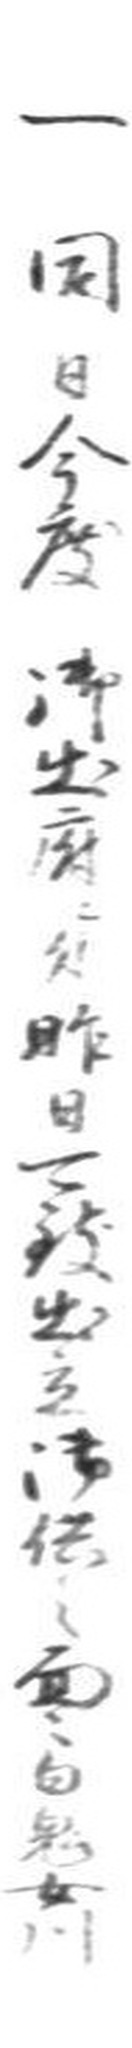一同日今度御出府ニ付昨日可致出立御供之面々白鬼女川
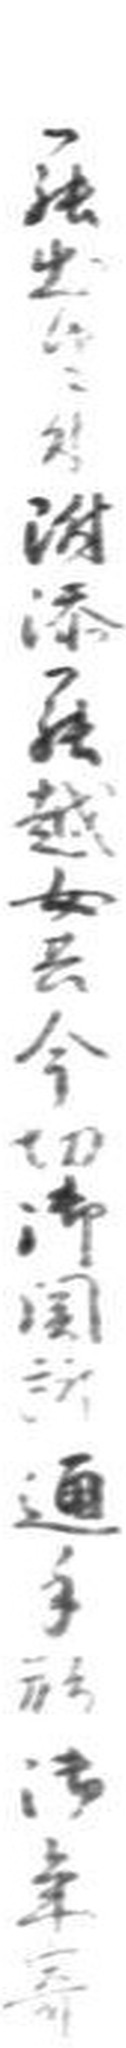罷出候ニ付附添罷越女共今切御関所通手形御年寄
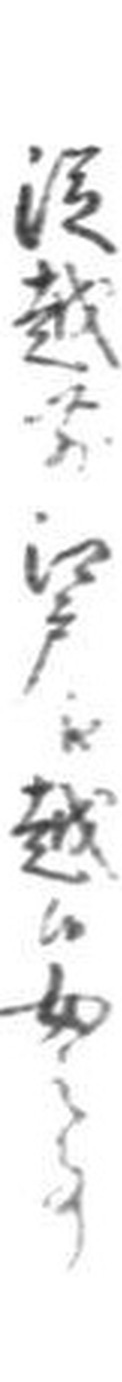従越前江戸江越候女之事
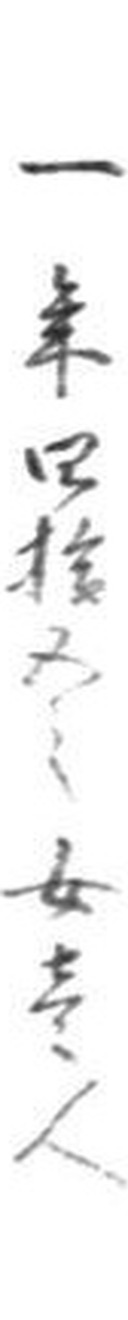一年四拾五之女壱人

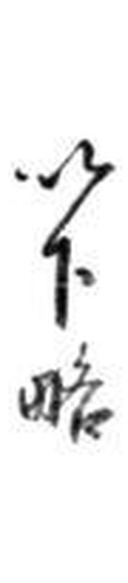以下略
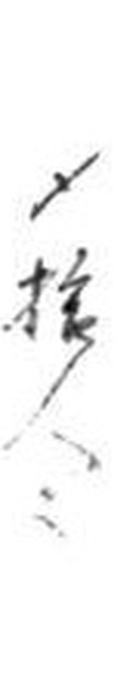〆拾人也
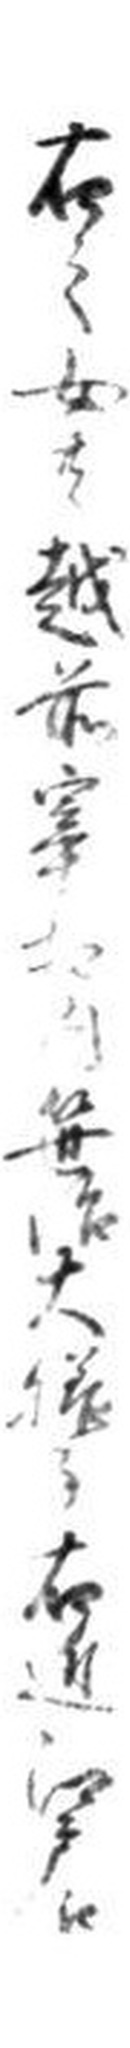右之女共越前宰相内笹治大膳子右近江戸江
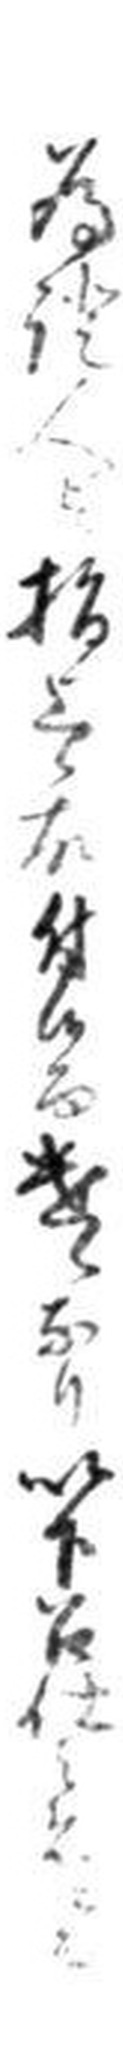為証人被指上候故付候而遣候なり以下召仕之者ニ而
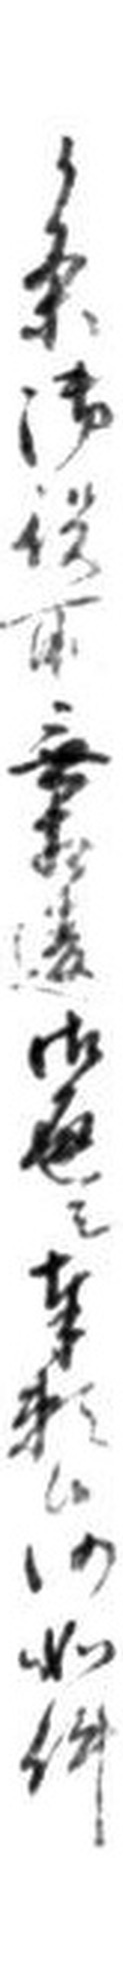候条御役所無相違御通シ奉頼候仍如件
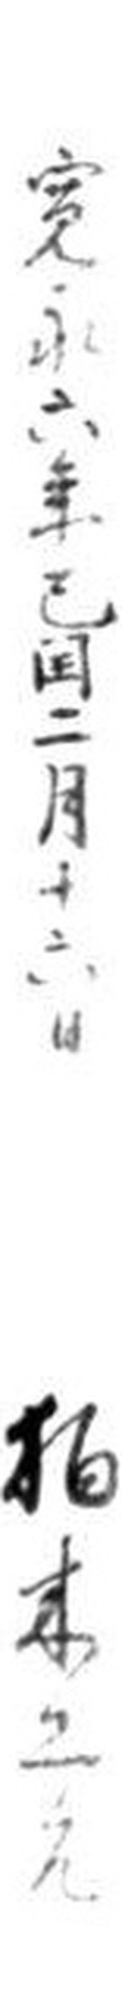寛永六年巳閏二月十六日狛木工允
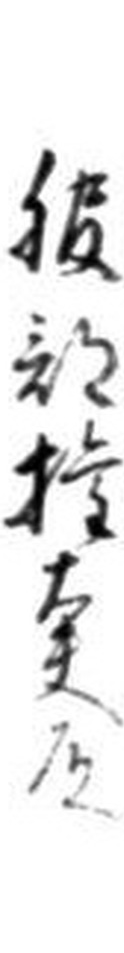服部権大夫殿
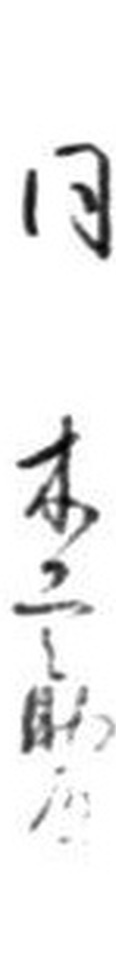同木工之助殿
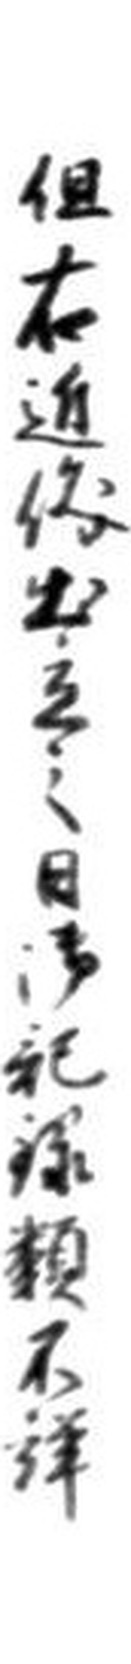但右近儀出立之日御記録類不詳
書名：家譜 三 忠昌公 従慶長八年到寛永六年
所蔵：福井県文書館 Fukui Prefectural Archives
